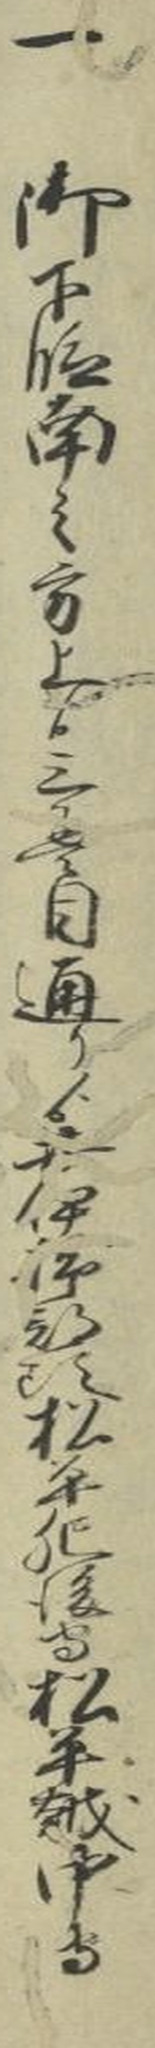一御下段南之方上ゟ三畳目通りゟ井伊掃部頭松平肥後守松平越中守
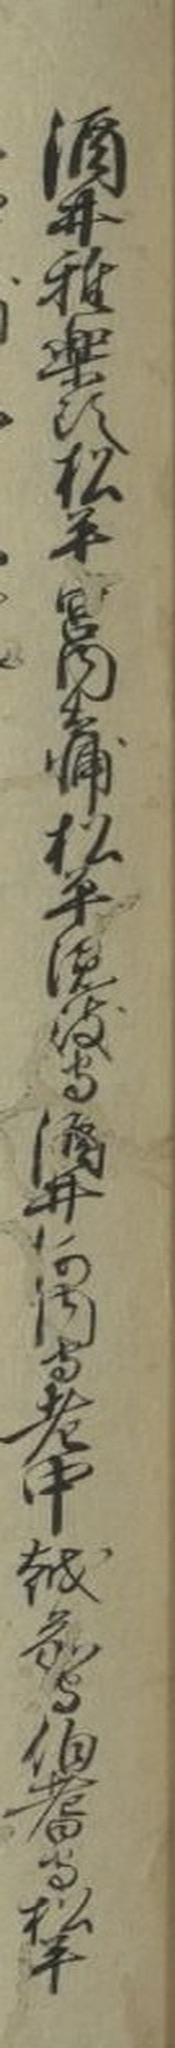酒井雅楽頭松平宮内太輔松平隠岐守酒井河内守老中越前守伯耆守松平
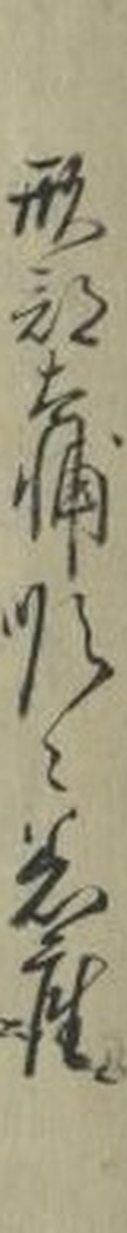刑部太輔順々着座
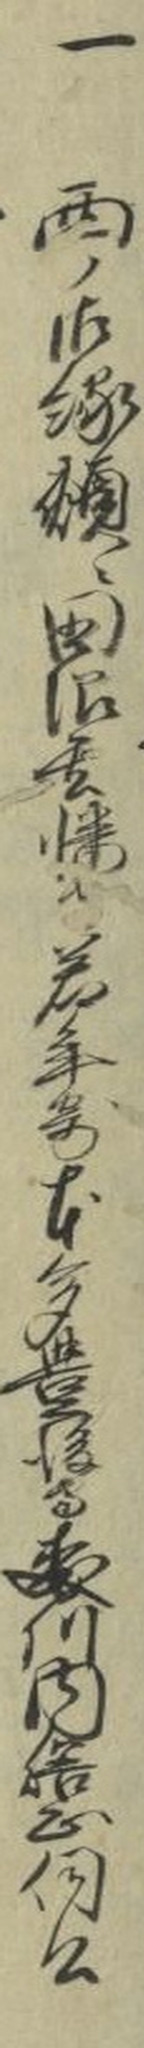一西の御縁頬に田沼玄播頭若年寄本多豊後守森川内膳正伺公
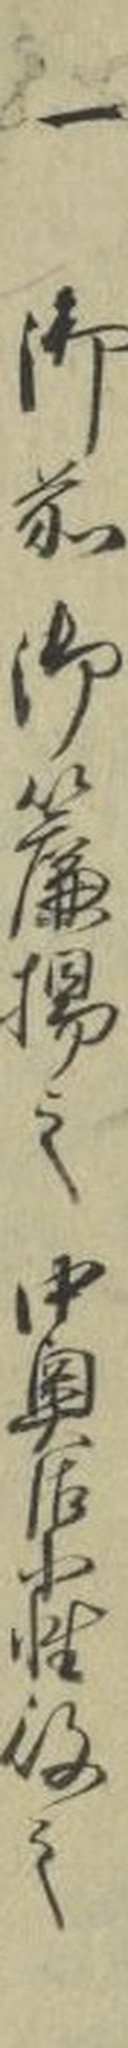一御前御簾揚之中奥御小性役之
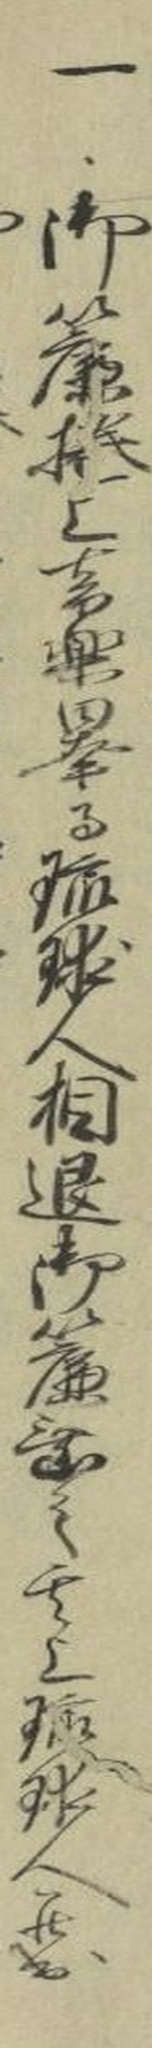一御簾捲上音楽畢る琉球人相退御簾垂之其上琉球人罷出
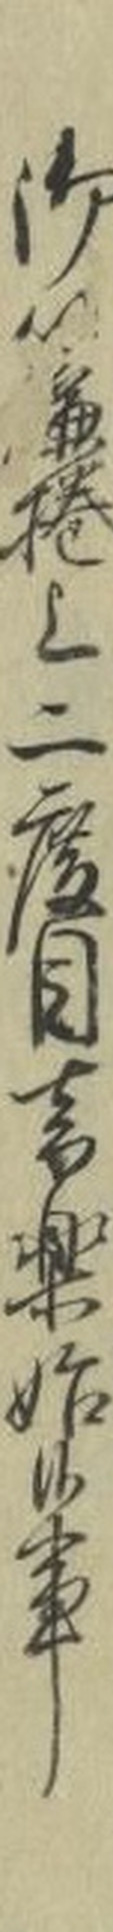御簾捲上二度目音楽始候事
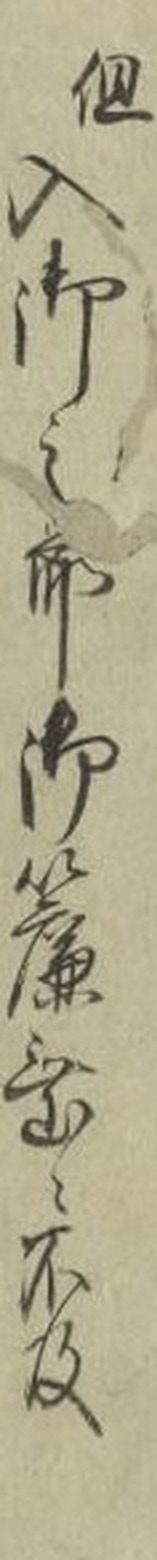但入御之節御簾垂に不及
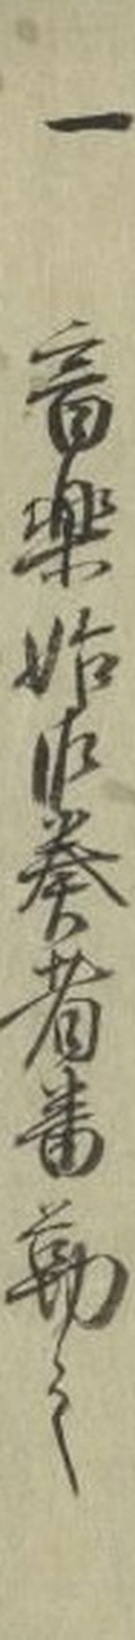一音楽始御奏者番勤之
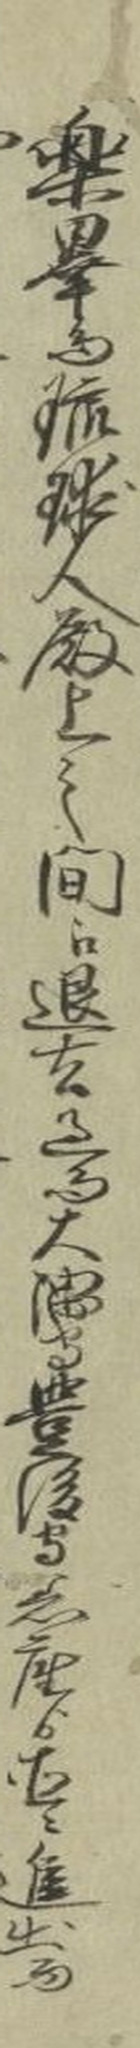一音楽畢て琉球人殿上之間え退去過て大隅守豊後守着座ゟ直に進出て
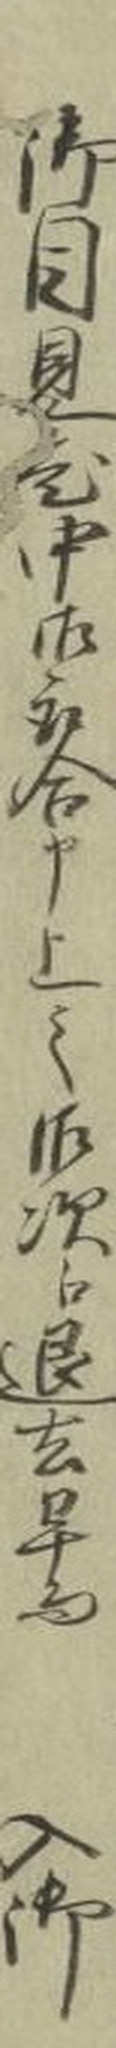御目見老中御取合申上之御次え退去畢て入御
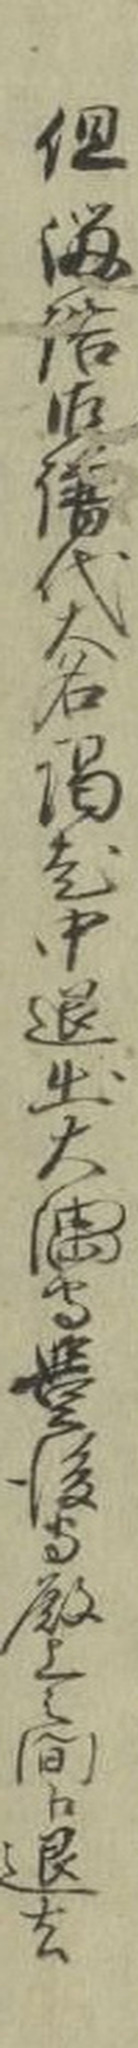一但溜詰御譜代大名謁老中退出大隅守豊後守殿上之間え退出

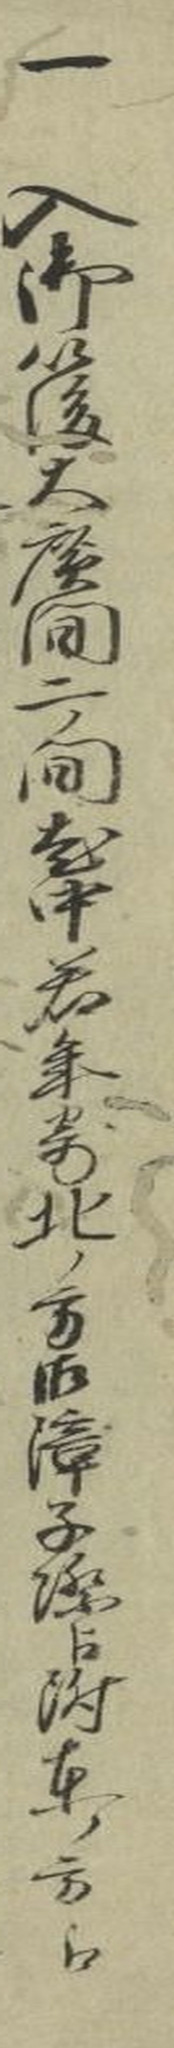一入御以後大広間二の間老中若年寄北の方御障子際え附東の方え
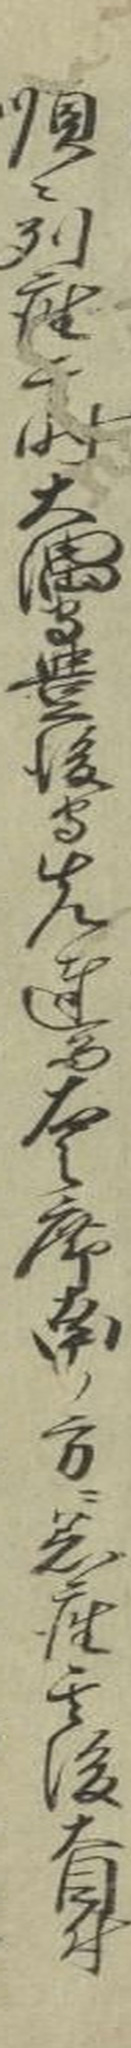順に列座其時大隅守豊後守先達て右之席南の方に着座其後大目付
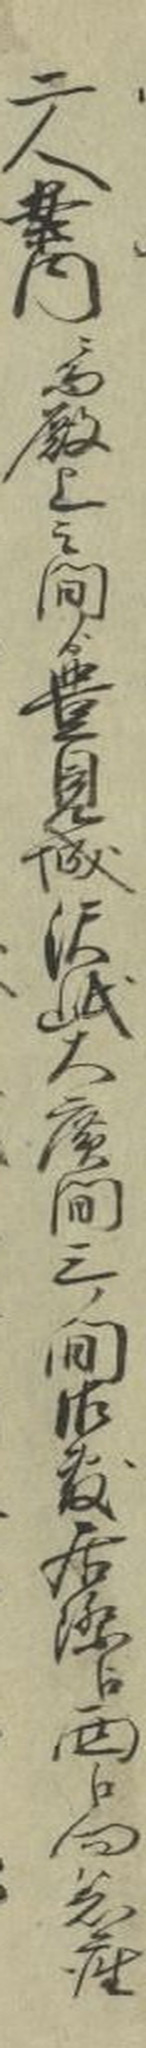二人案内にて殿上之間ゟ豊見城沢岻大広間三之間御敷居際え西え向着座
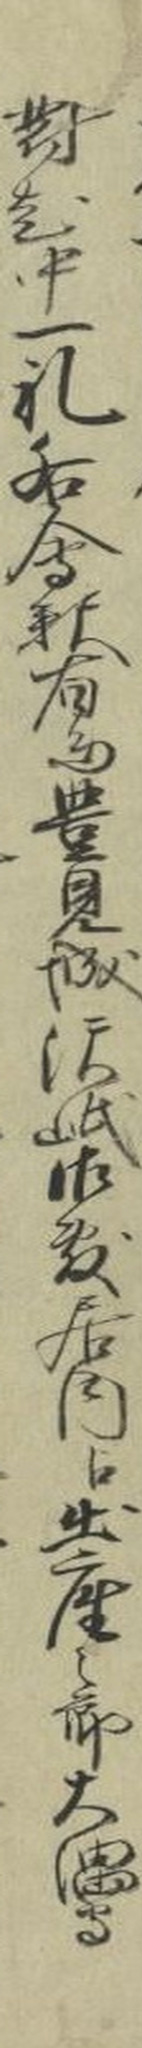対老中一礼各会釈有て豊見城沢岻御敷居内え出座之節大隅守
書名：天保三壬辰年琉球人参府之節勤方書留
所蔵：University of the Ryukyus Library
